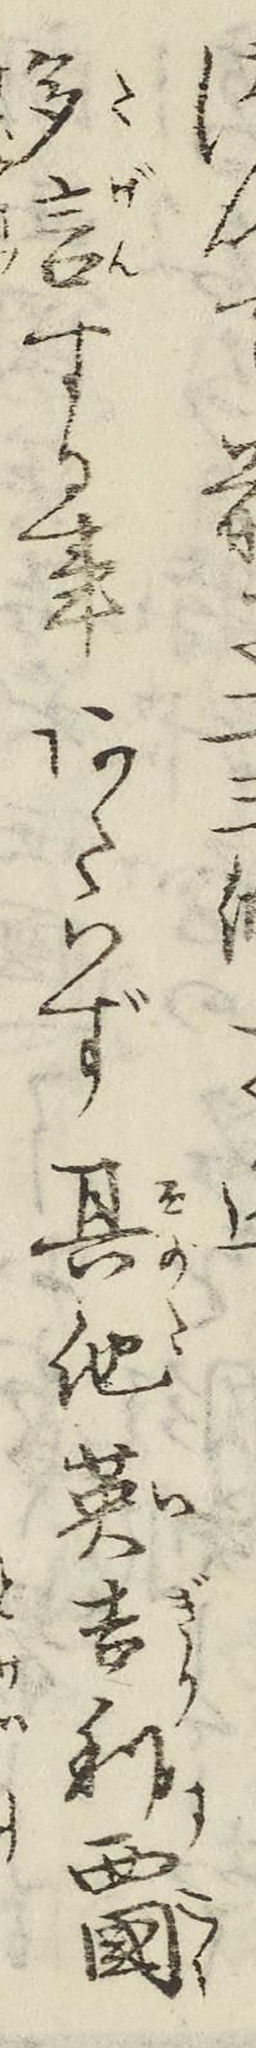多言する事あたはず其他英吉利西国
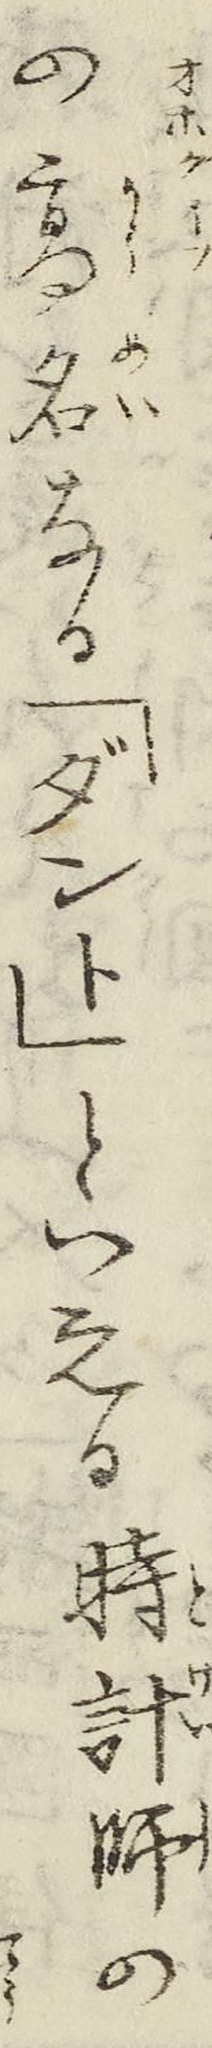の高名なる「ダント」といえる時計師の
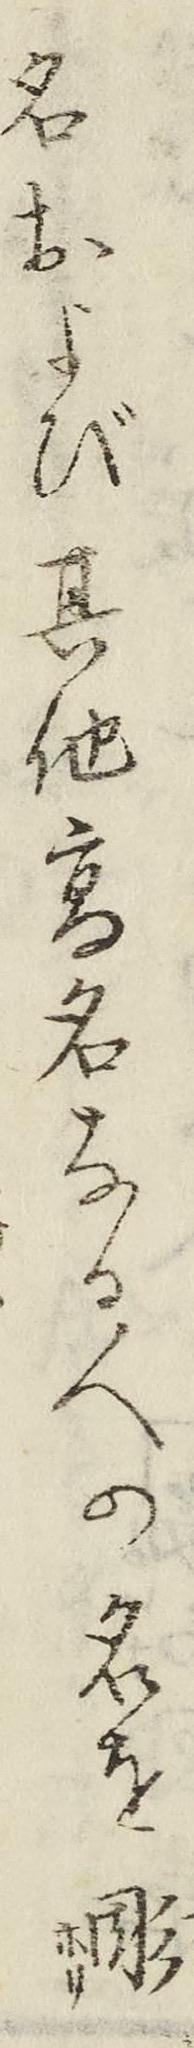名および其他高名なる人の名を彫
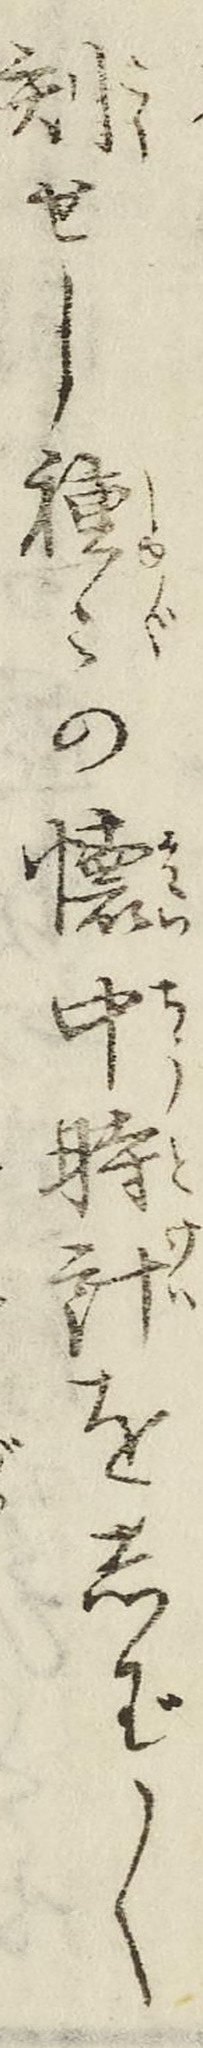刻せし種〻の懐中時計をしば〳〵
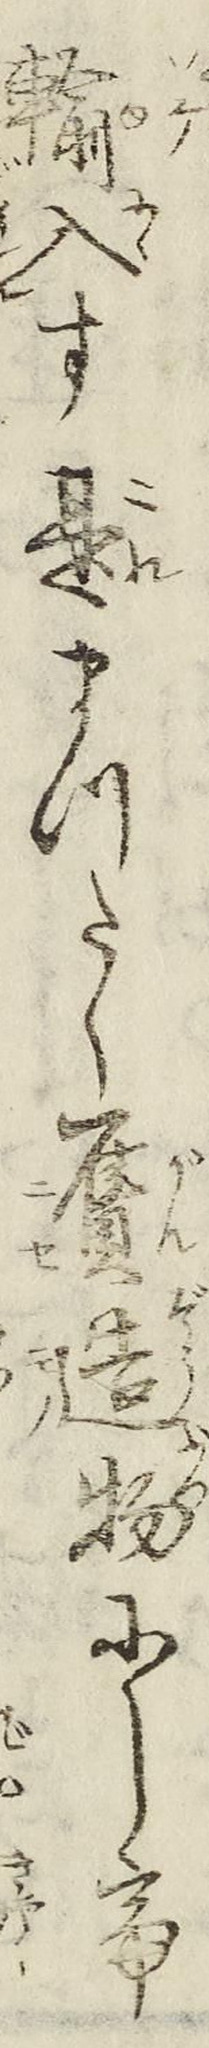輸入す是まつたく贋造物にして
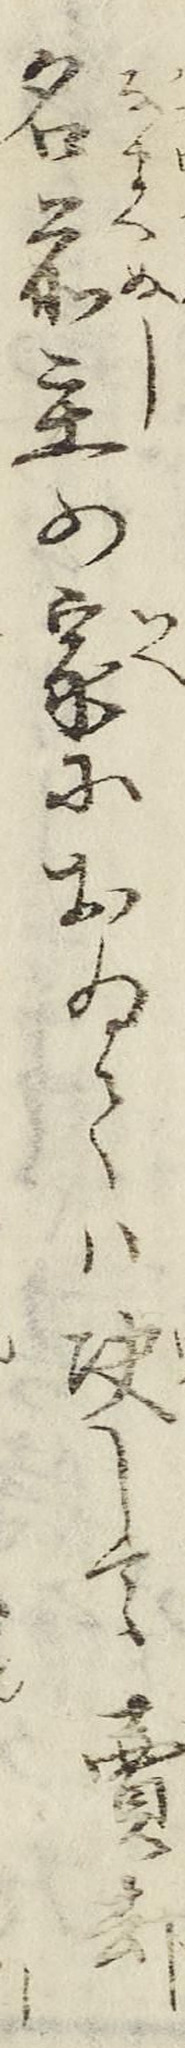名前主の家におゐては決して売却
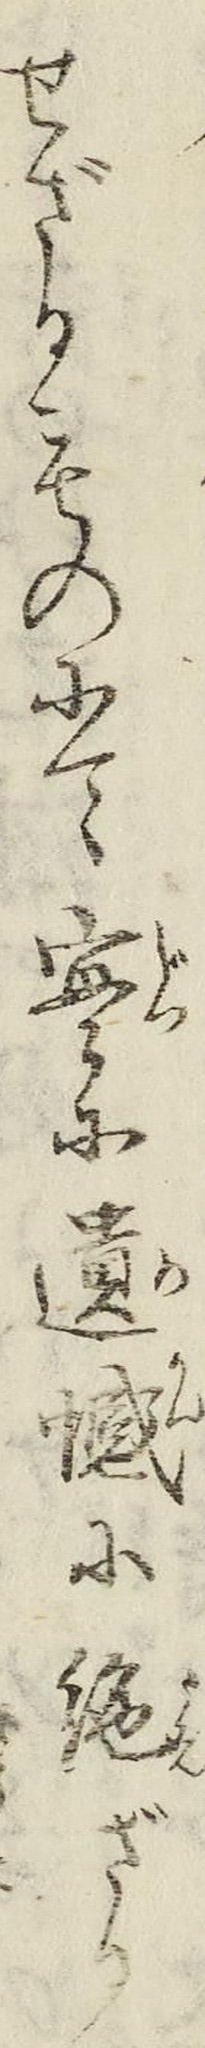せざるものにて実に遺憾に絶ざる次
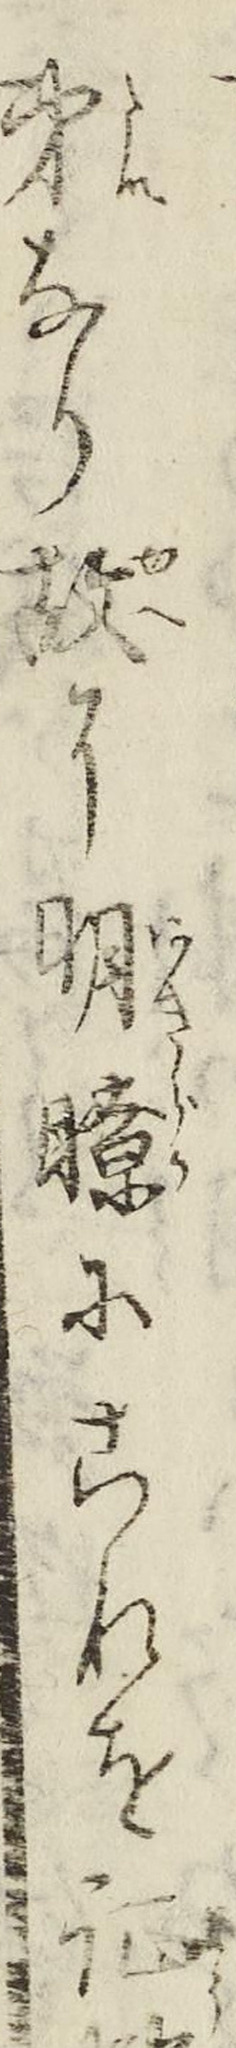第なり故に明瞭にこれを証拠？
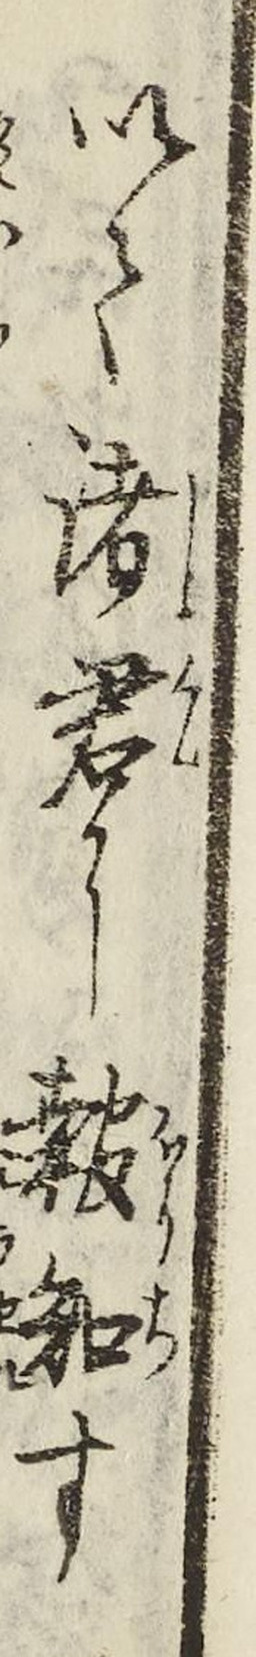以て諸君に報知す
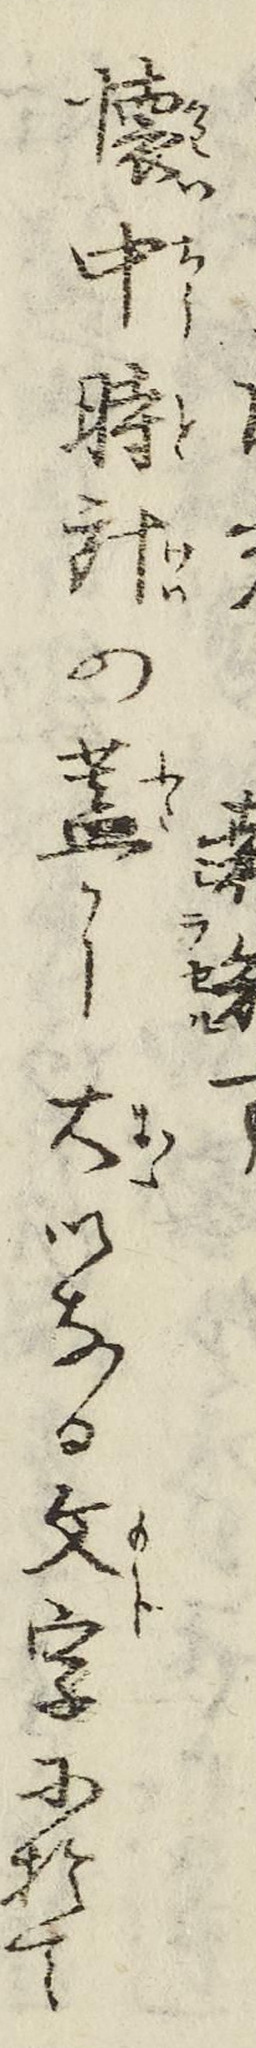懐中時計の蓋に大いなる文字に於て
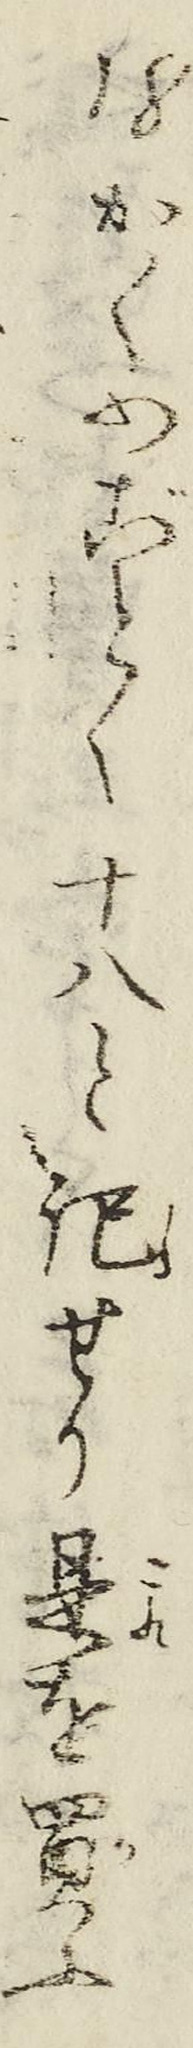８１かくのごとく十八と記せり是を買ふ
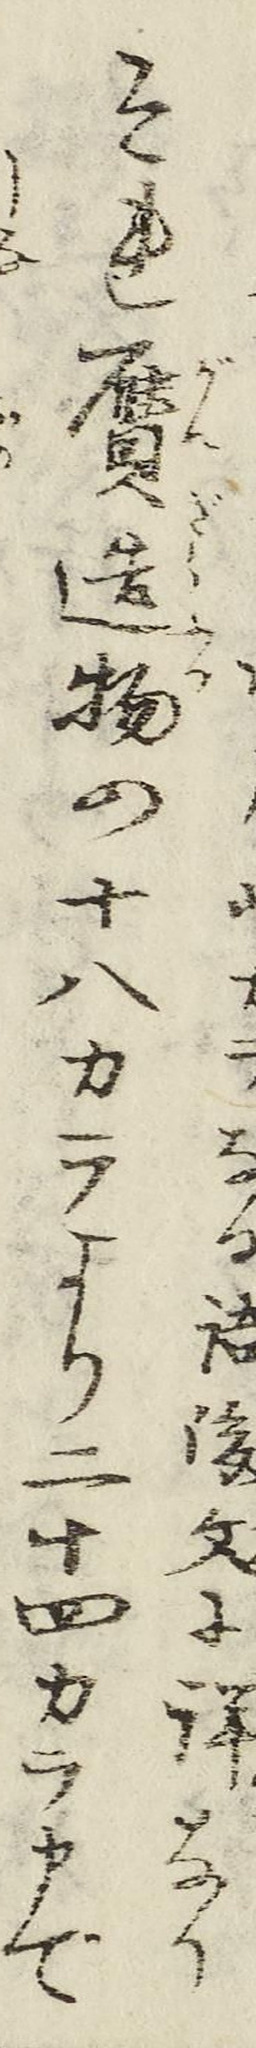それ贋造物の十八カラより二十四カラまで
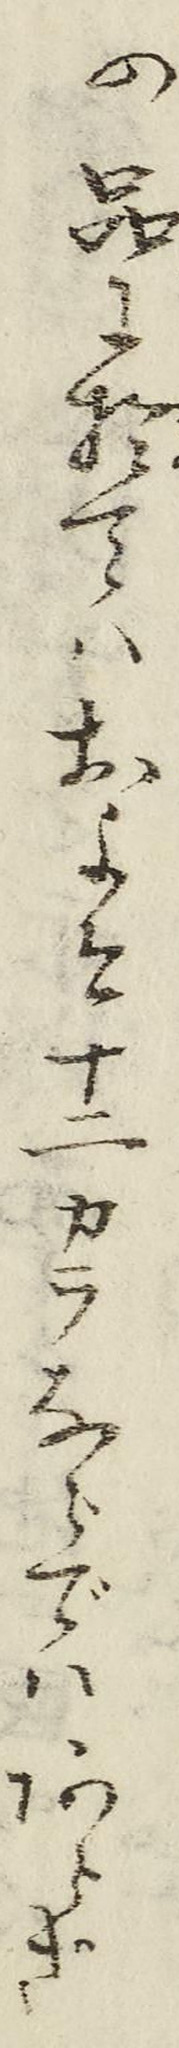の品に於てはおよそ十二カラならではあらざ
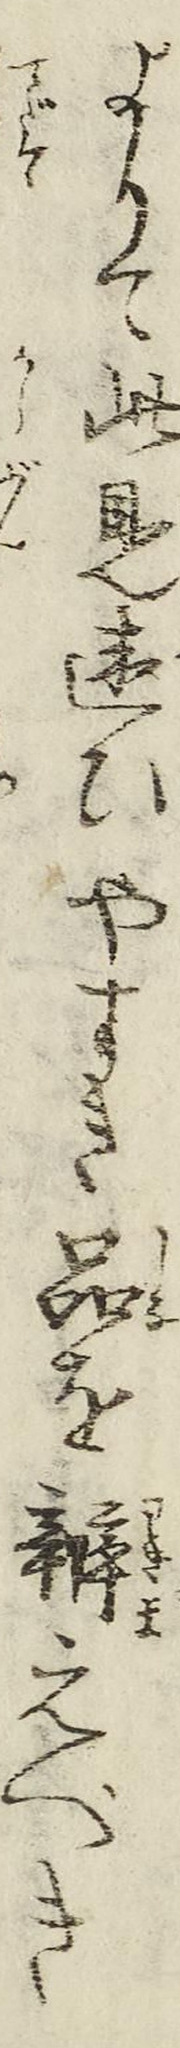よりて此見違ひやすき品を弁えべき
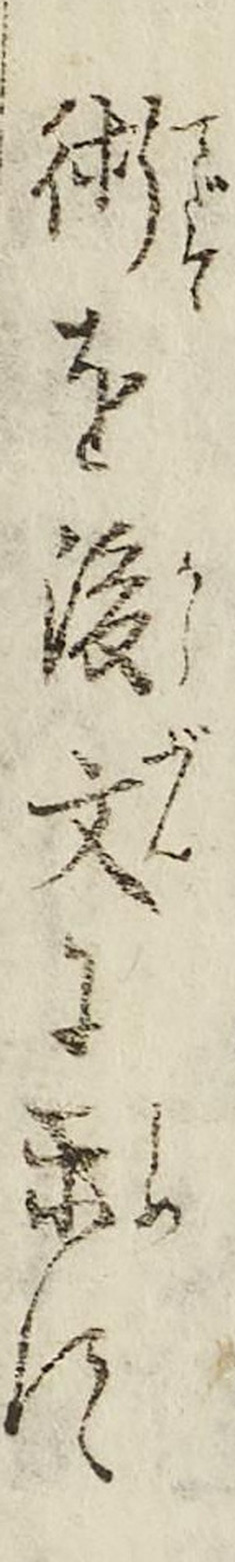術を後文に示す

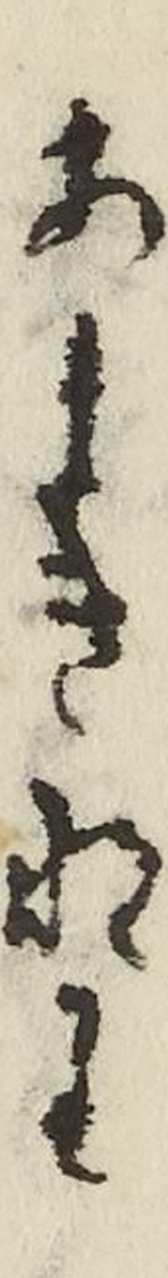あしきなり
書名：[時計に関する冊子]
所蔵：東京大学地震研究所図書室 Earthquake Research Institute Library, The University of Tokyo, JAPAN
